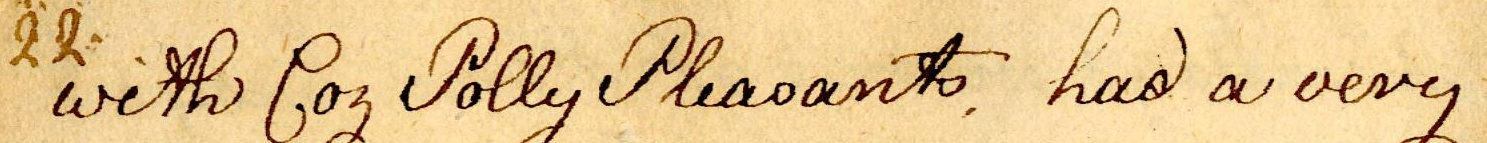with Coz Polly Pleasants, had a very
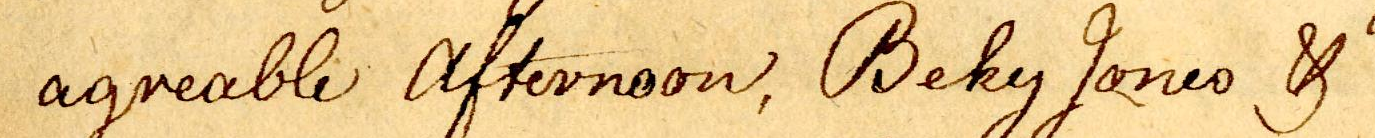agreable Afternoon, Beky Jones &
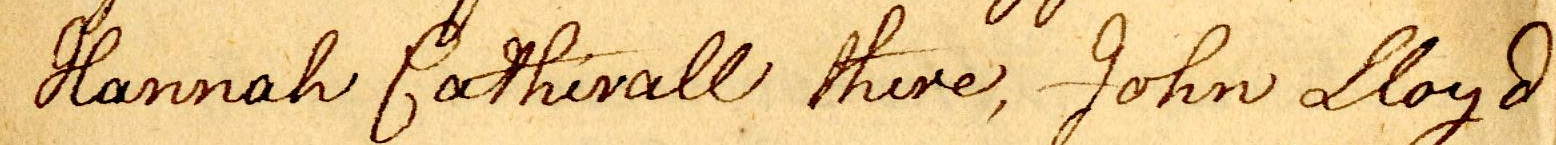Hannah Cathirall there, John Lloyd
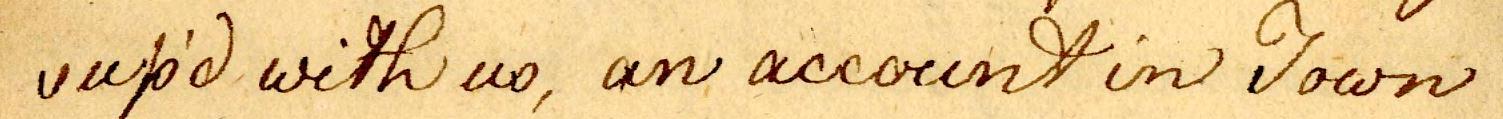sup'd with us, an account in Town
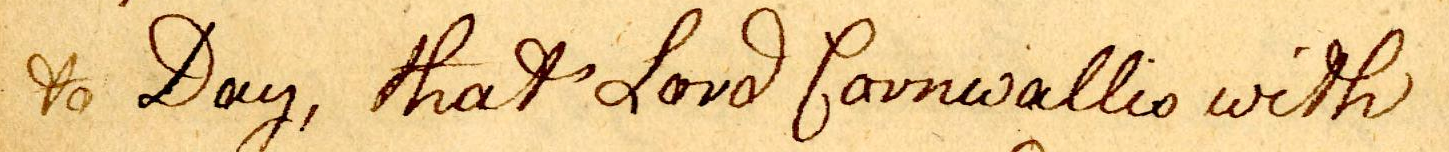to Day, that Lord Cornwallis with
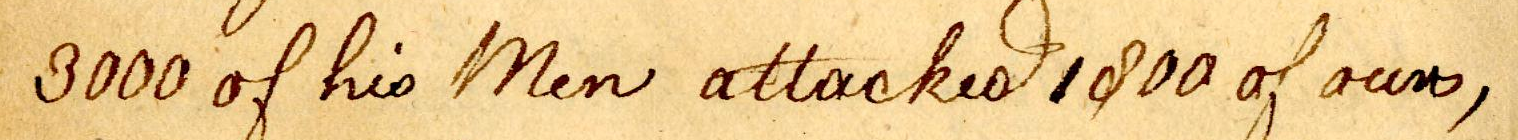3000 of his Men attacked 1000 of ours,
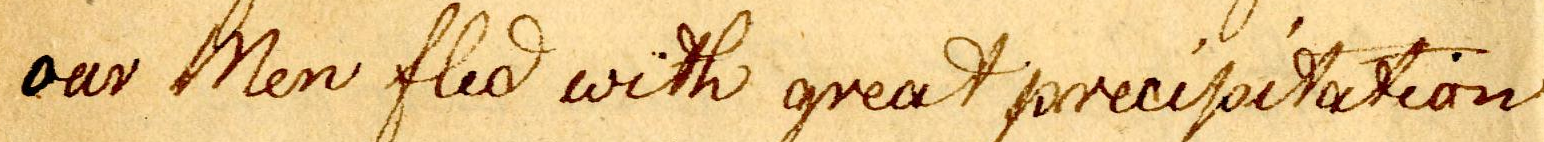our Men fled with great precipitation
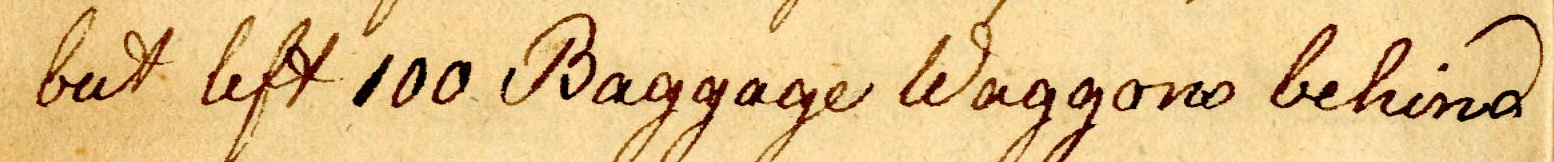but left 100 Baggage Waggons behind
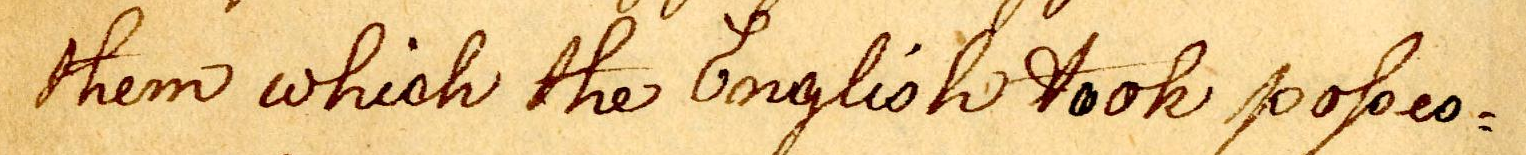them which the English took posses-
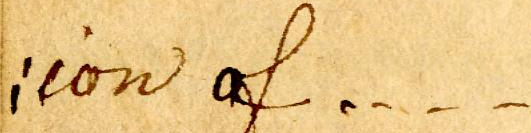-ion of -
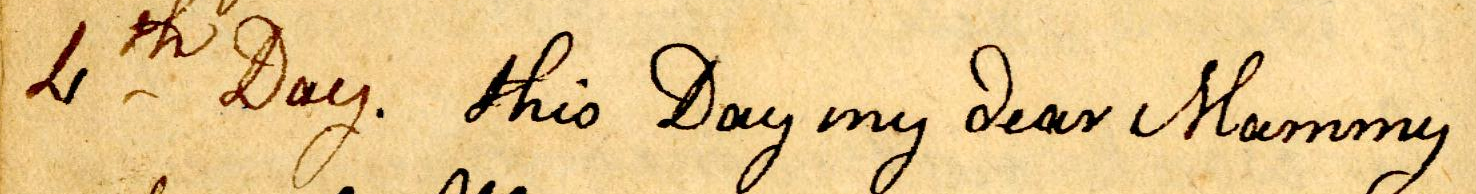4^th Day. this Day my dear Mammy
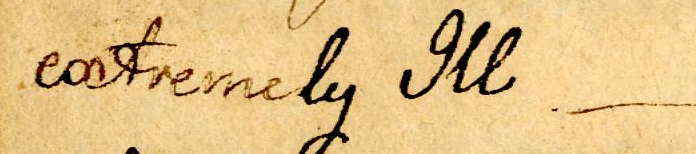extremely Ill -
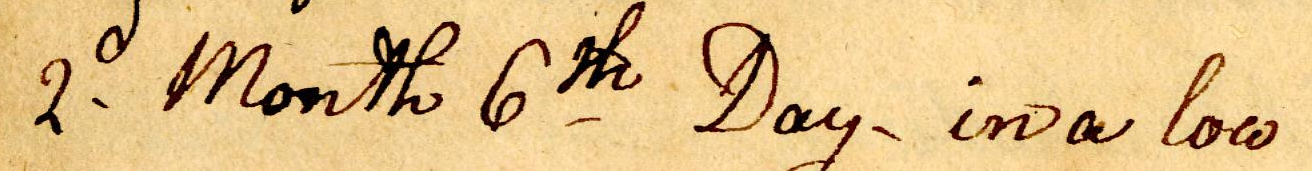2^d Month 6^th Day. in a low
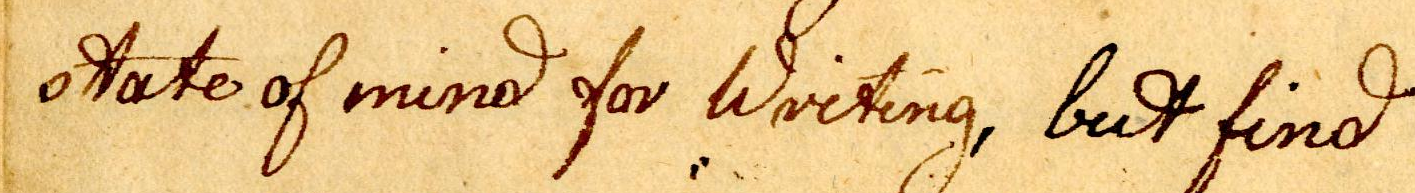state of mind for Writing, but find
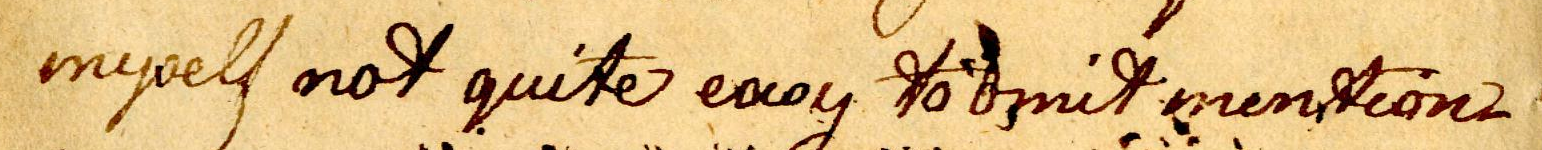myself not quite easy to omit mention-
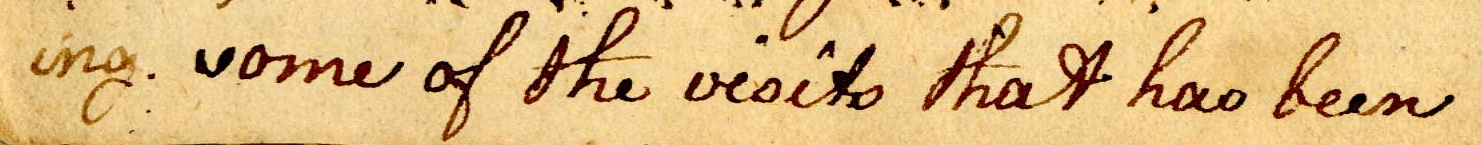ing. some of the visits that has been
